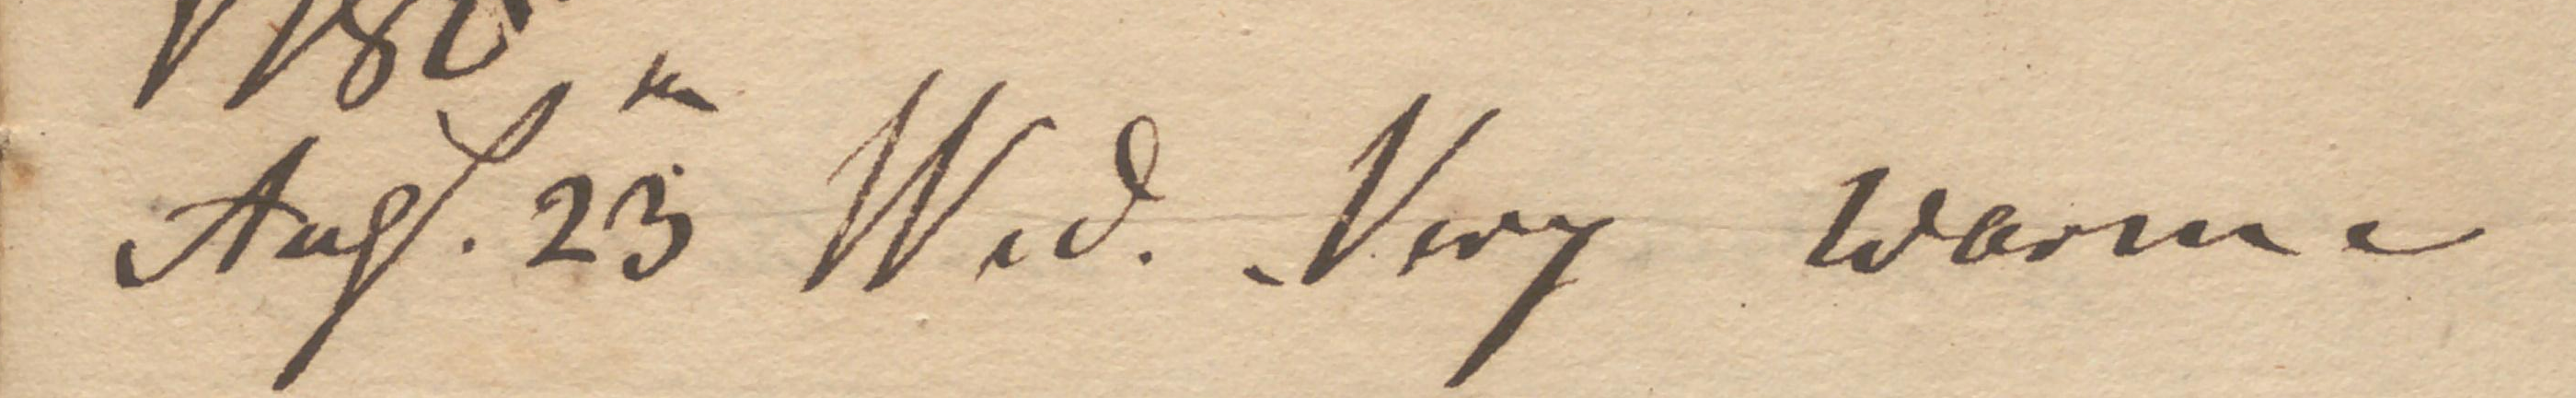Aug^t. 23^th Wed. Very warme
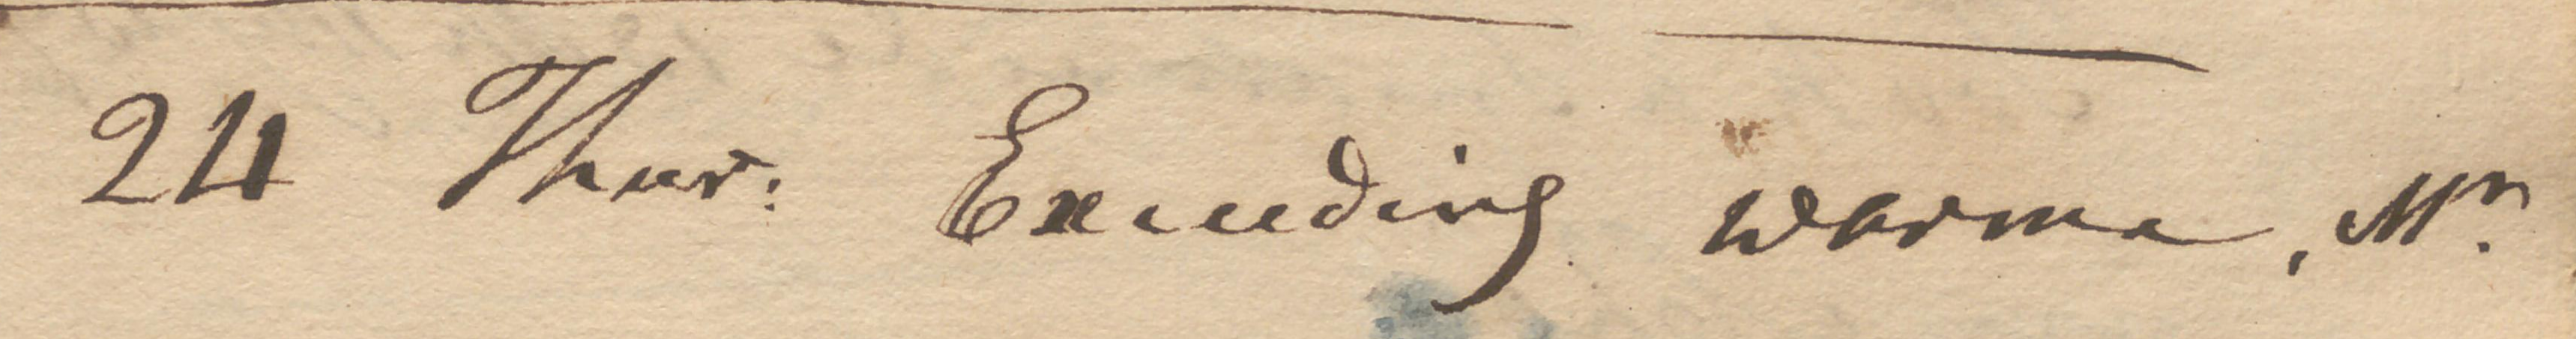24 Thur. Exceeding warme M^r.
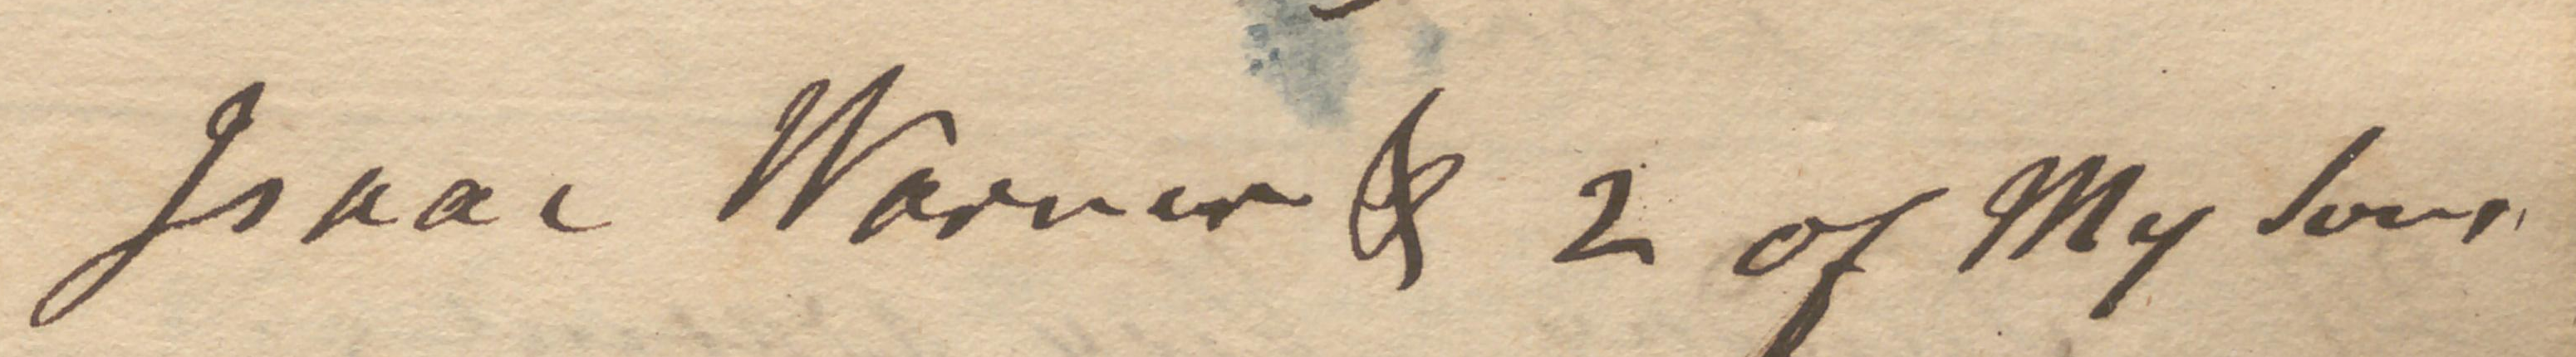Isaac Warner & 2 of My sons
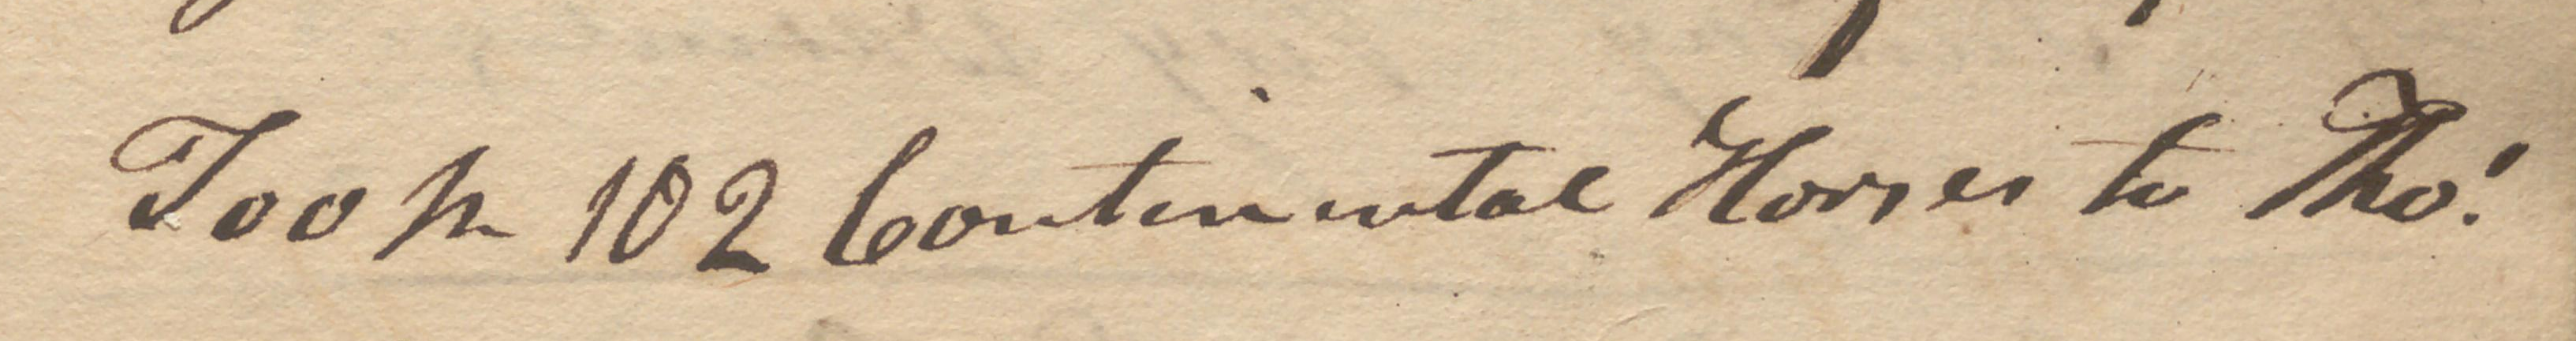Took 102 Continintal Horses to Tho^s.
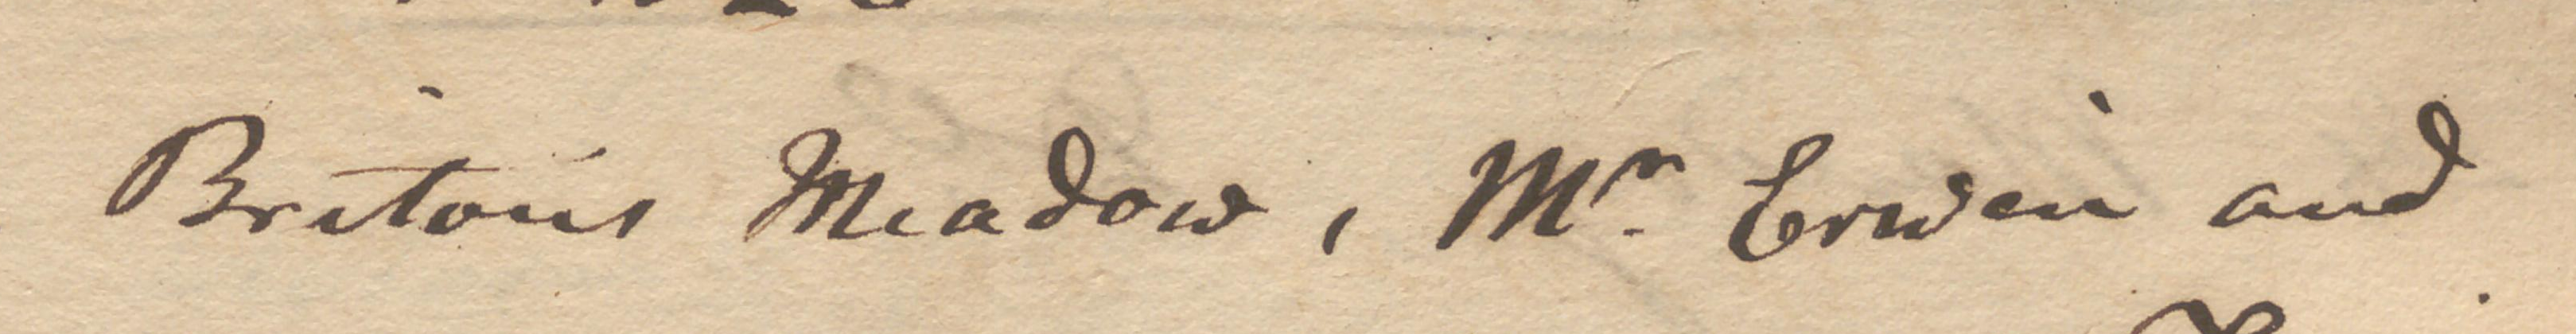Britons Meadow, M^r. Erwin and
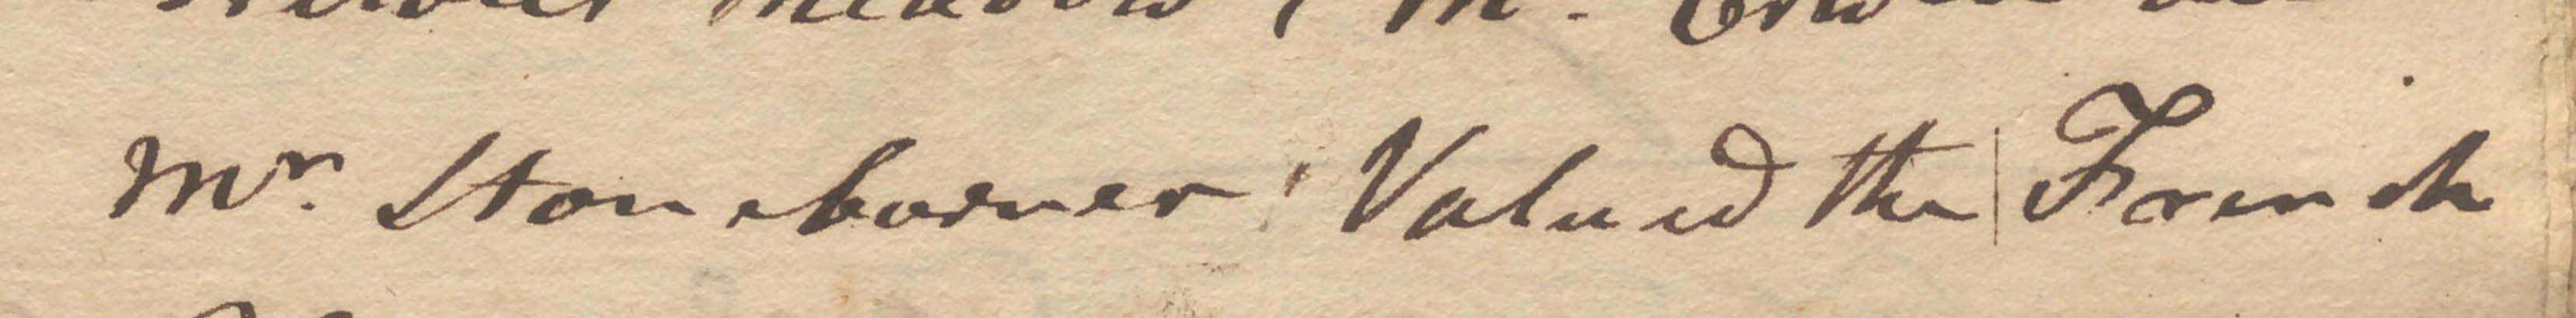M^r. Stoneburner Valued the French
